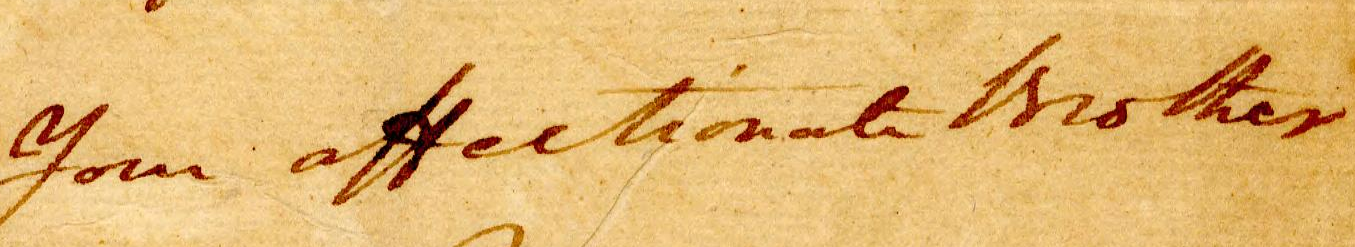Your affectionate Brother
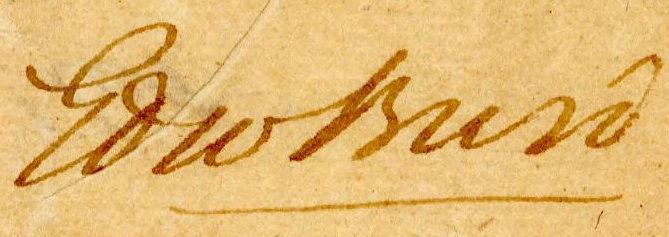Edw Burd
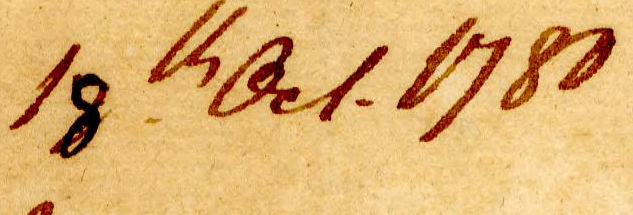18^th Oct. 1780
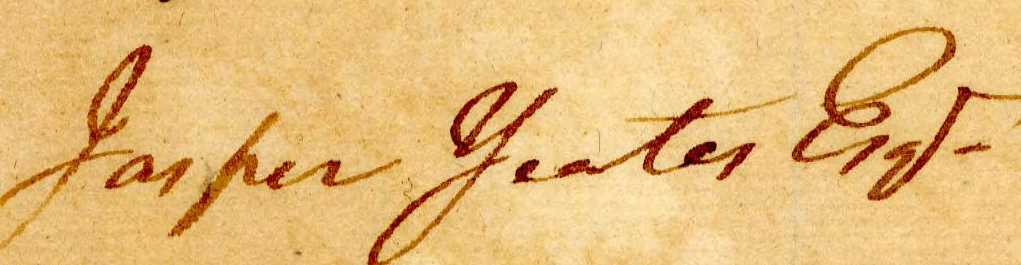Jasper Yeates Esq^r.
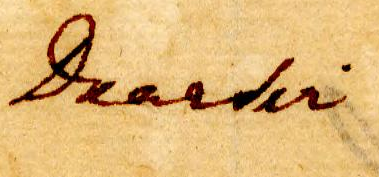Dear Sir
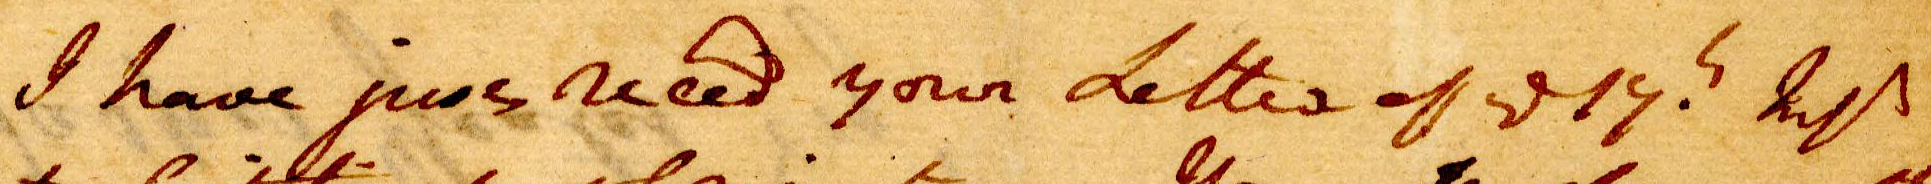I have just reced your Letter of y^e 14^h Inst.
